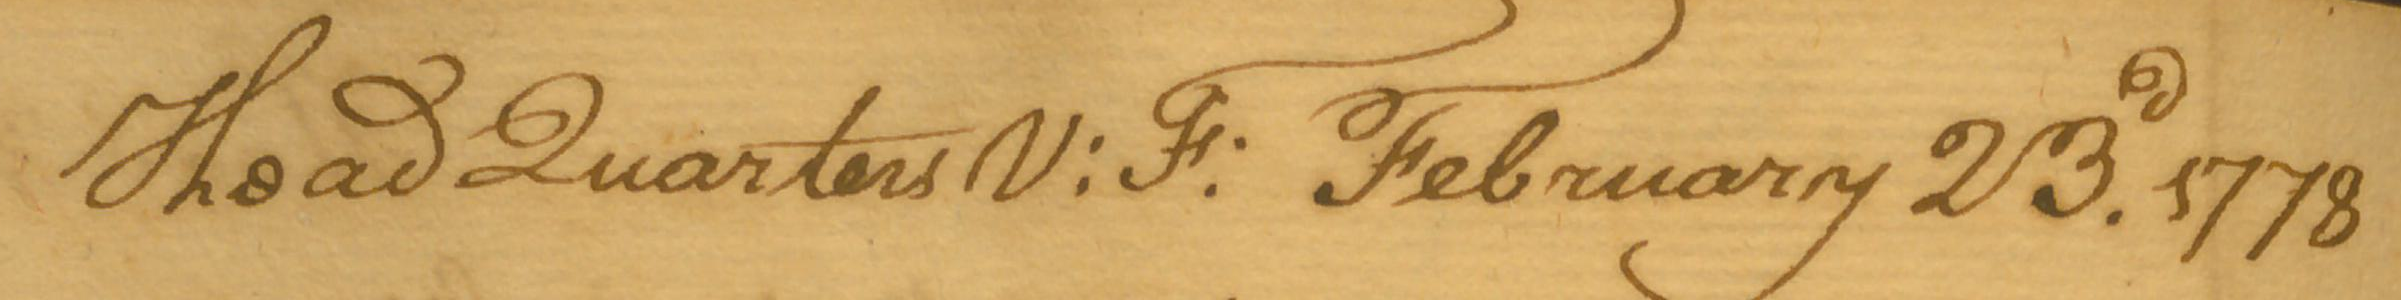Head Quarters V: F: February 23^d. 1778
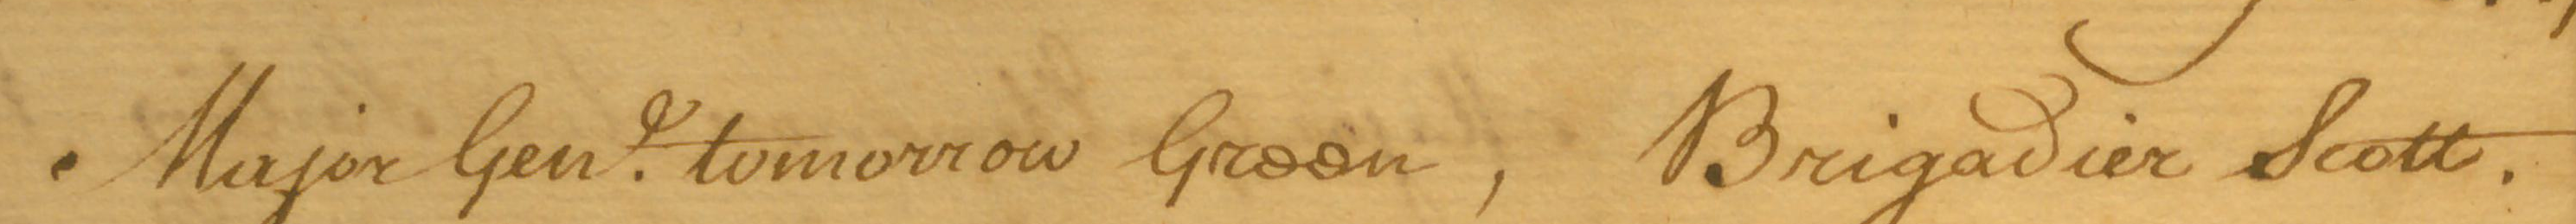Major Gen^l. tomorrow Green, Brigadier Scott.
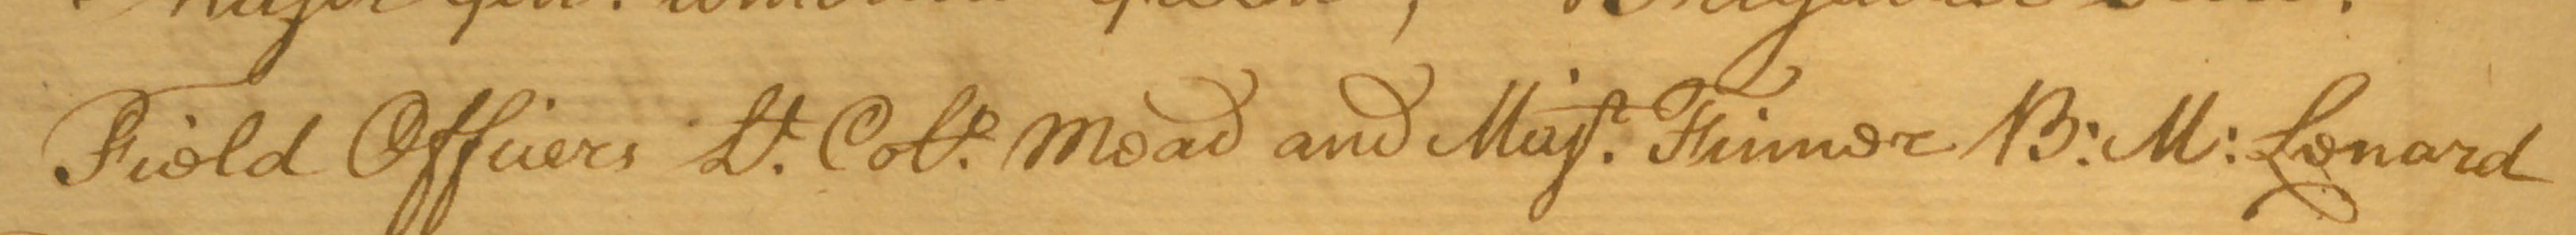Field Officers L^t. Col^o. Mead and Maj^r. Finner B: M: Lenard
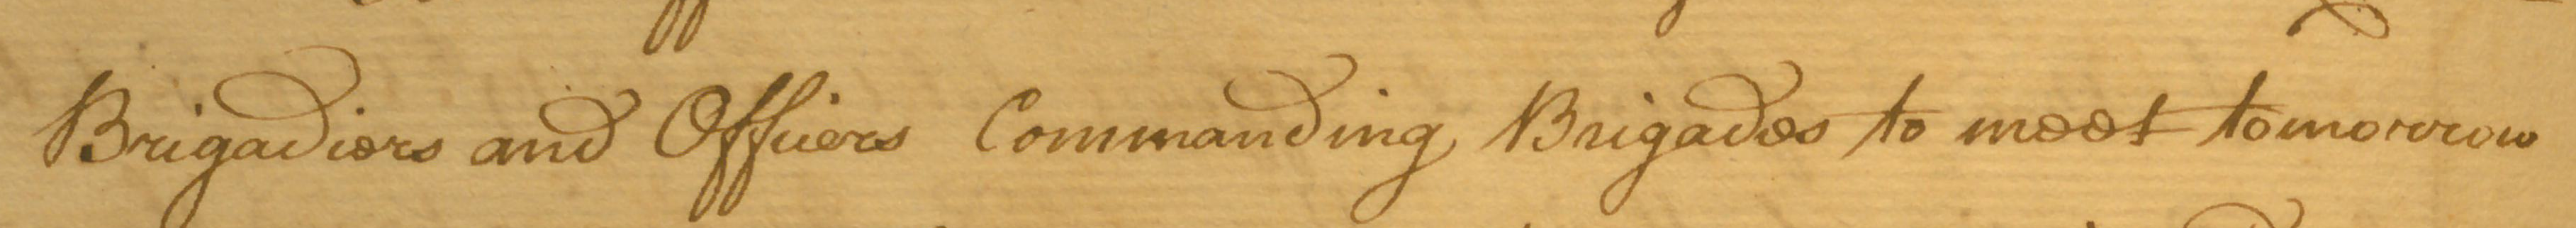Brigadiers and Officers Commanding Brigades to meet tomorrow
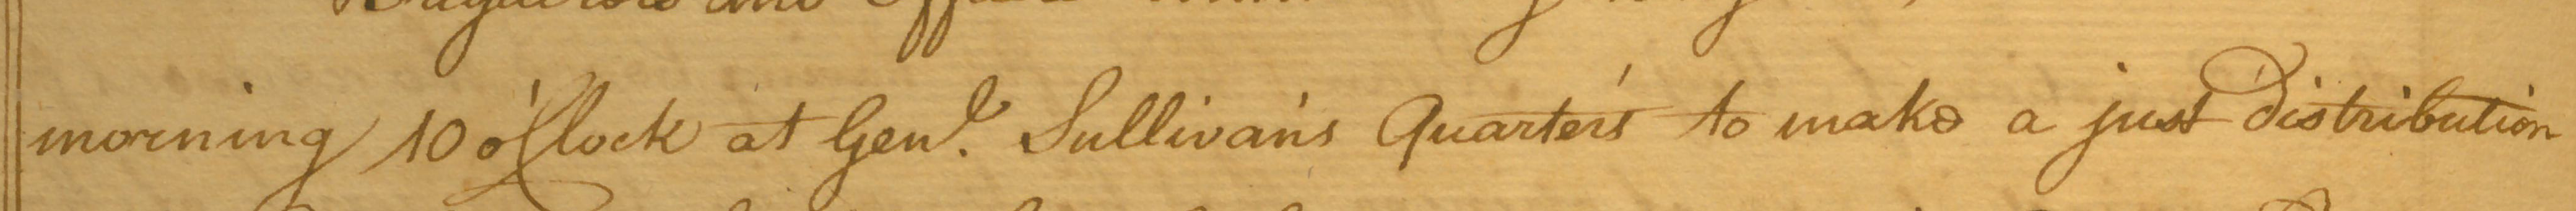morning 10 o'Clock at Gen^l. Sullivan's quarters to make a just distribution
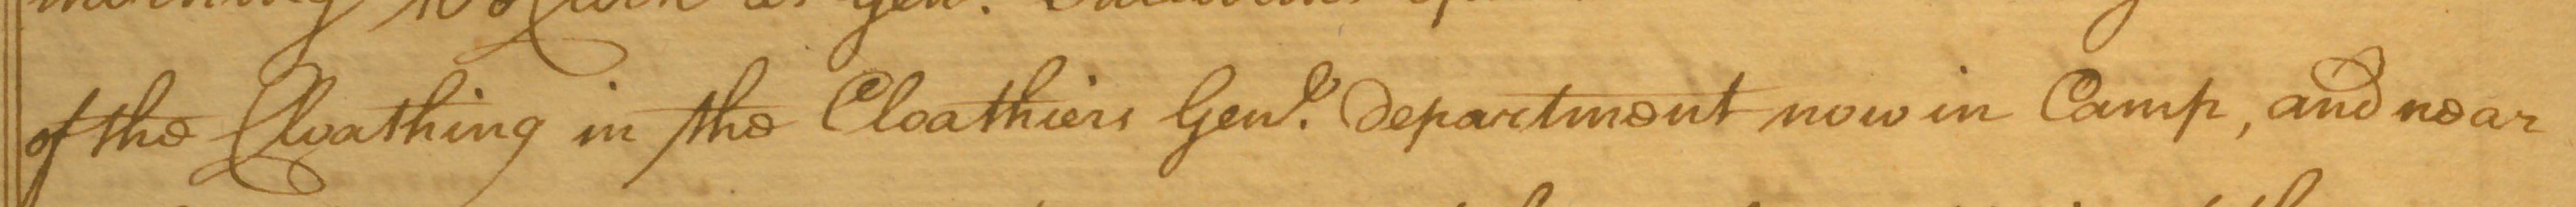of the Cloathing in the Cloathiers Gen^l. department now in Camp, and near
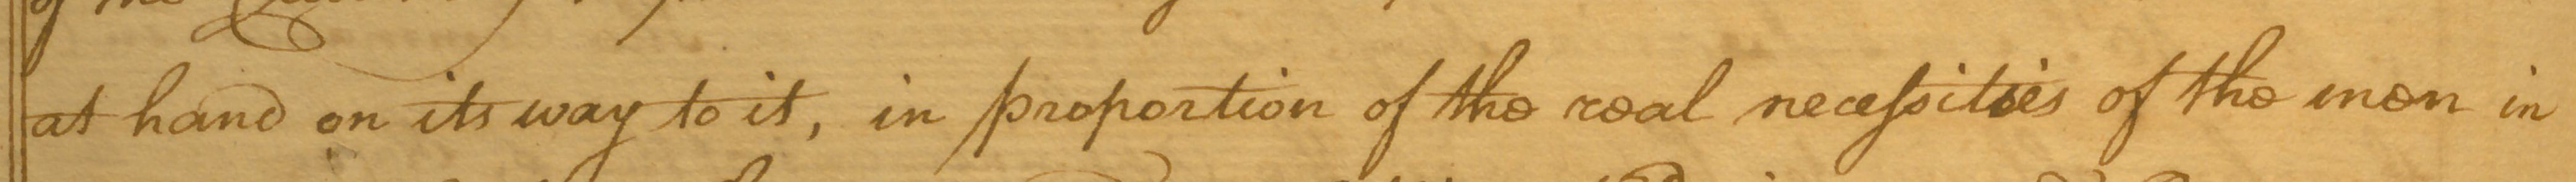at hand on its way to it, in proportion of the real necessities of the men in
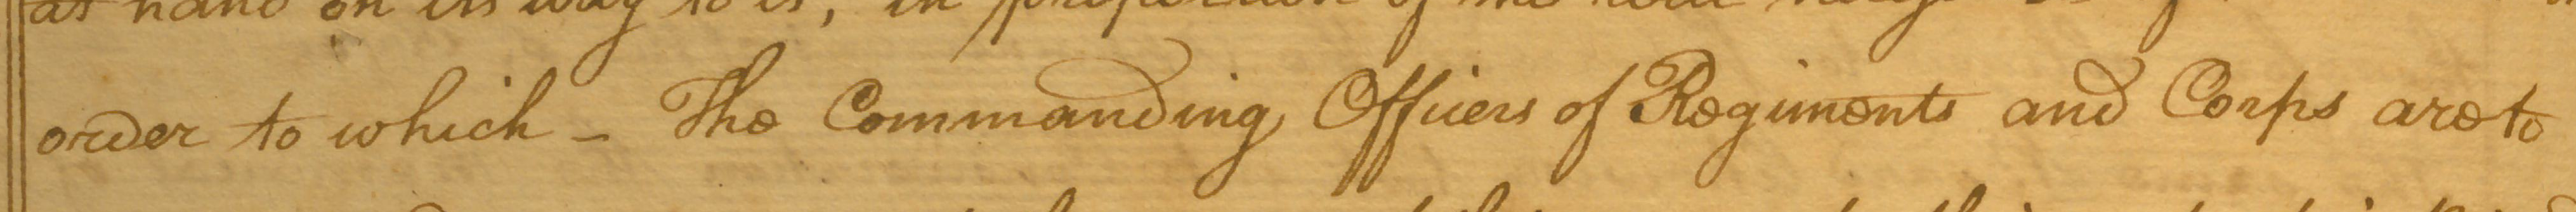order to which- The Commanding Officers of Regiments and Corps are to
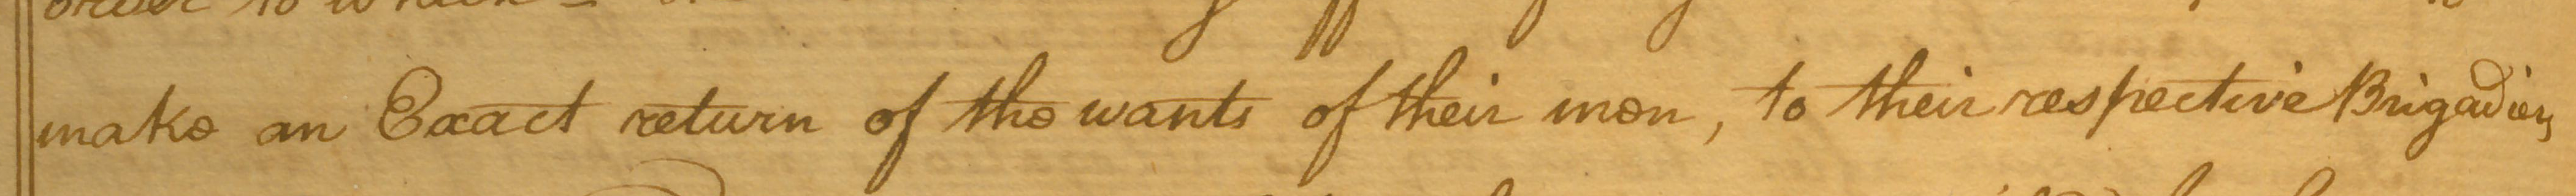make an Exact return of the wants of their men, to their respective Brigadiers
